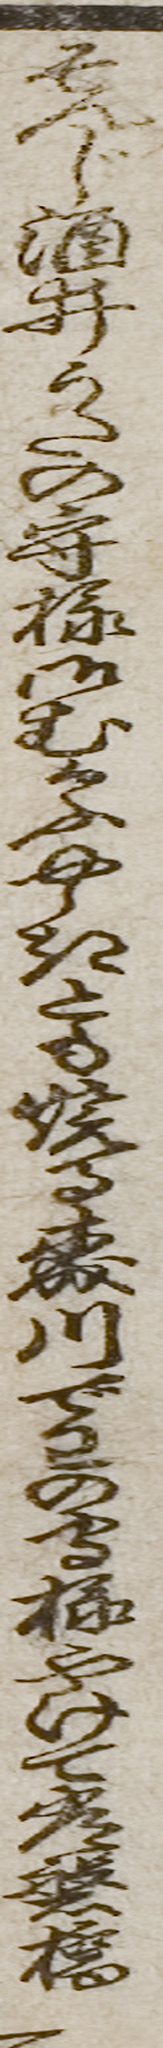そんじ酒井うたの守様御むかふやしきとも焼る森川でわの守様やけて常磐橋
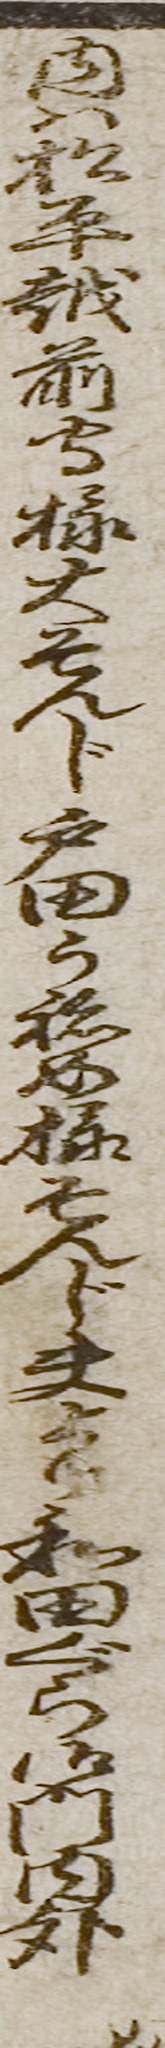内は松平越前守様大そんじ戸田うねめ様そんじ夫より和田ぐら御門内外
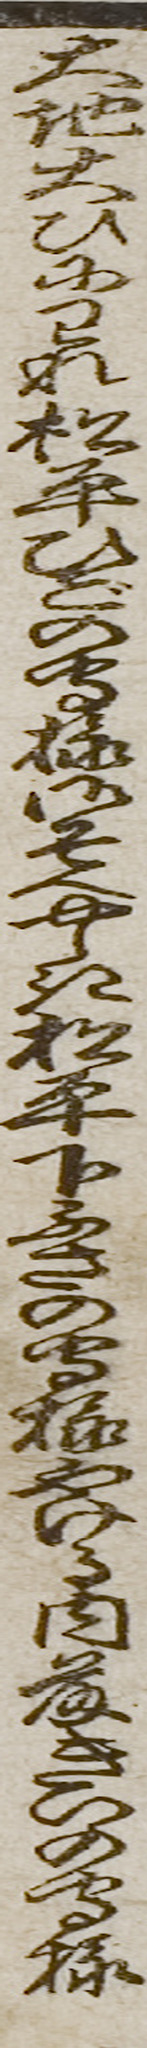大地大ひにわれ松平ひごの守様御そへやしき松平下ふさの様やける内藤きいの守様
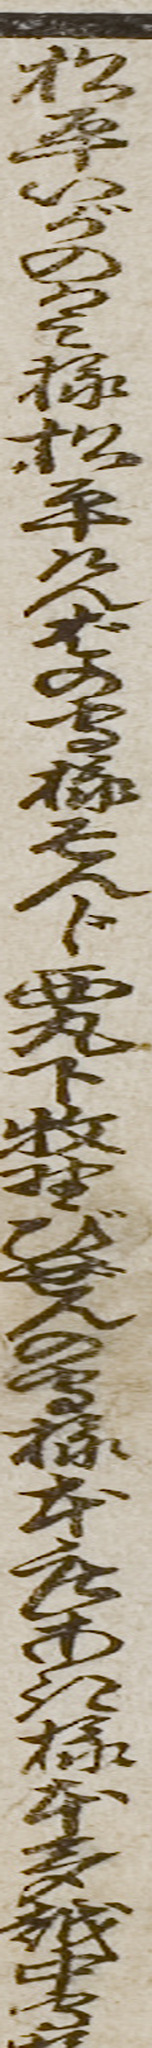松平いがのかみ様松平けんばの守様そんじ西丸下牧野びぜんの守様本庄あき様本多越中守様
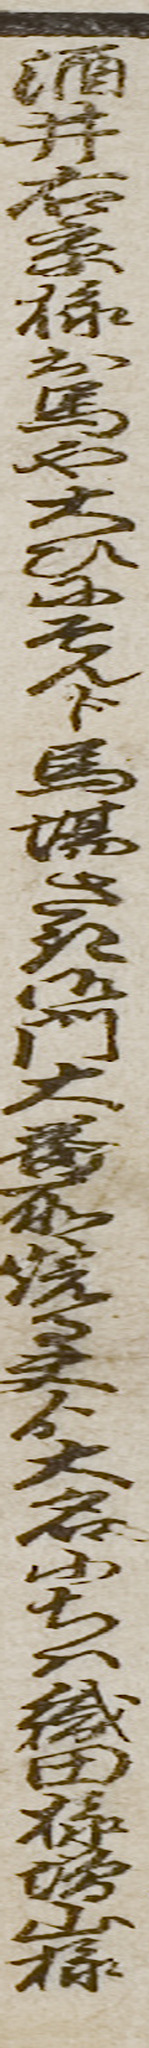酒井右京様お馬や大ひにそんじ馬場さき御門大番所焼る夫ゟ大名小ちは織田様増山様
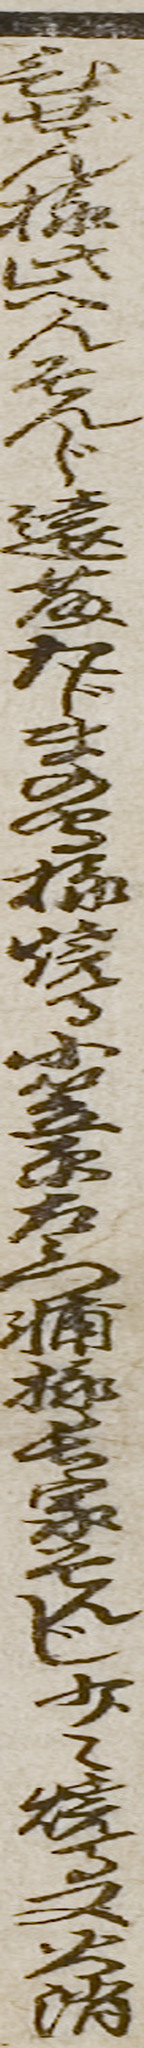ひぜん様此へんそんじ遠藤たじまの守様焼る小笠原左衛門輔様長家そんじ少々焼る又火消
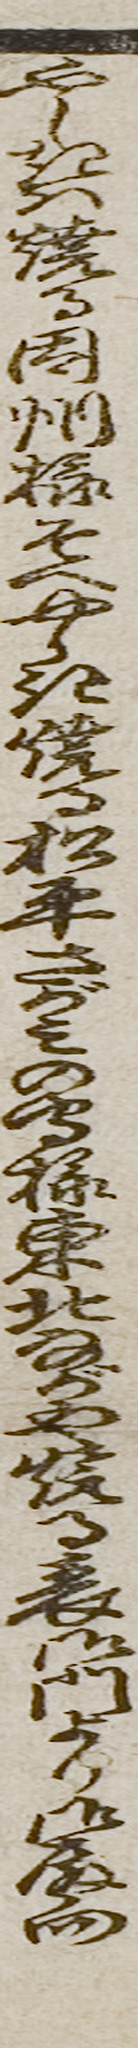やしきは焼る因州様そへやしき焼る松平さがみの守様東北ながや焼る表御門より御殿向
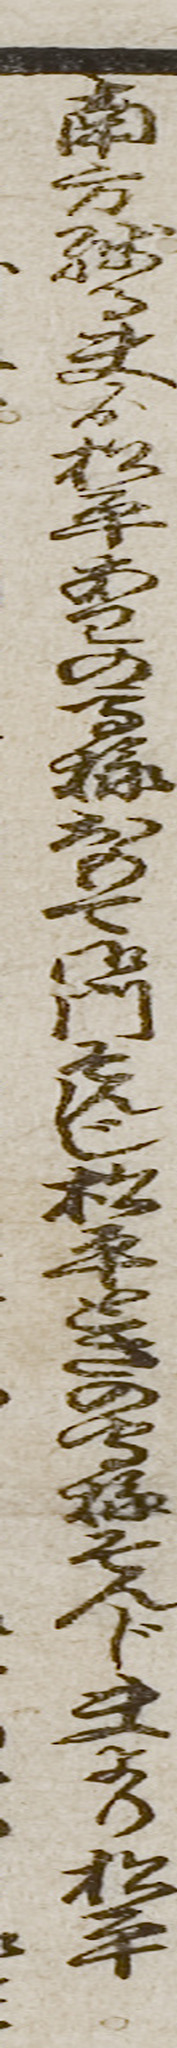南方残る夫ゟ松平あわの守様おもて御門そんじ松平とさの守様そんじ夫より松平
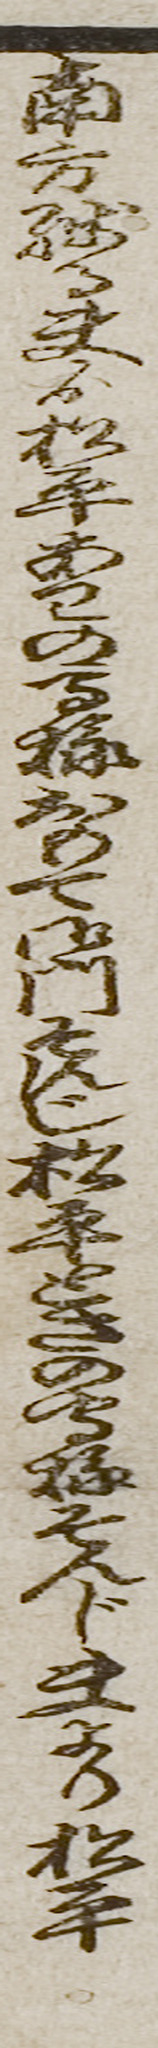南方残る夫ゟ松平あわの守様おもて御門そんじ松平とさの守様そんじ夫より松平
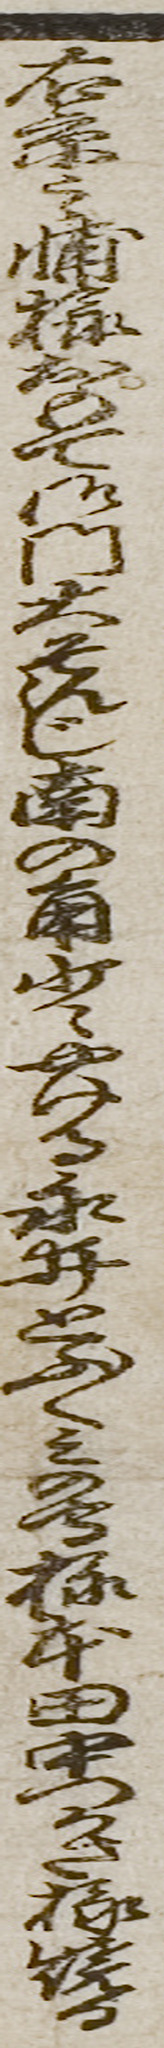右京之輔様おもて御門大そんじ南の角少々やける永井とふ〱みの守様本田中つかさ様焼る
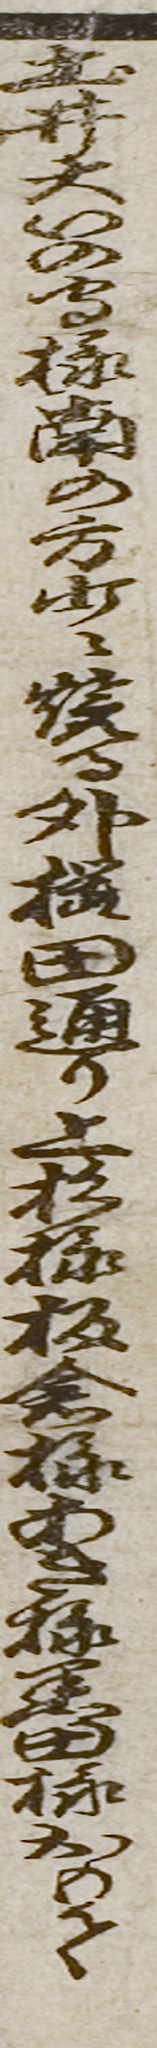土井大いの守様南の方少々焼る外桜田通り上杉様板倉様あき様黒田様おもて
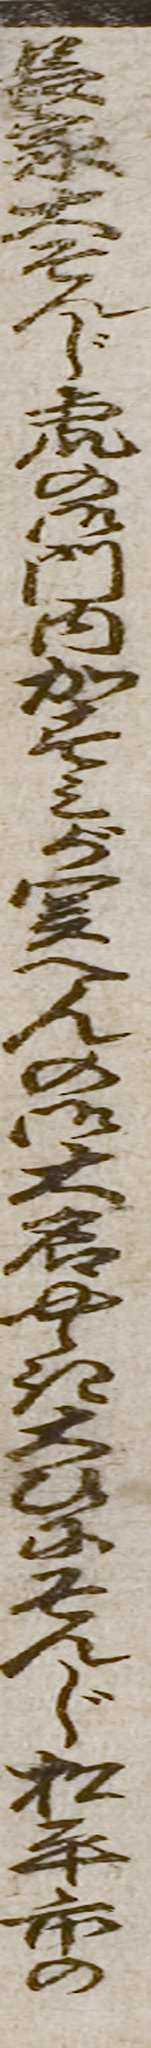長家大そんじ虎の御門内かすみが関へんの御大名やしき大ひにそんじ松平市の
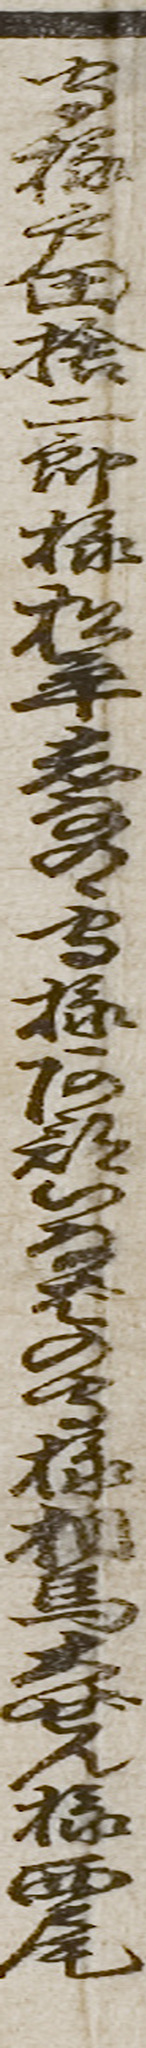守様戸田捨二郎様松平しなのゝ守様阿部いなばの守様相馬大ぜん様西尾
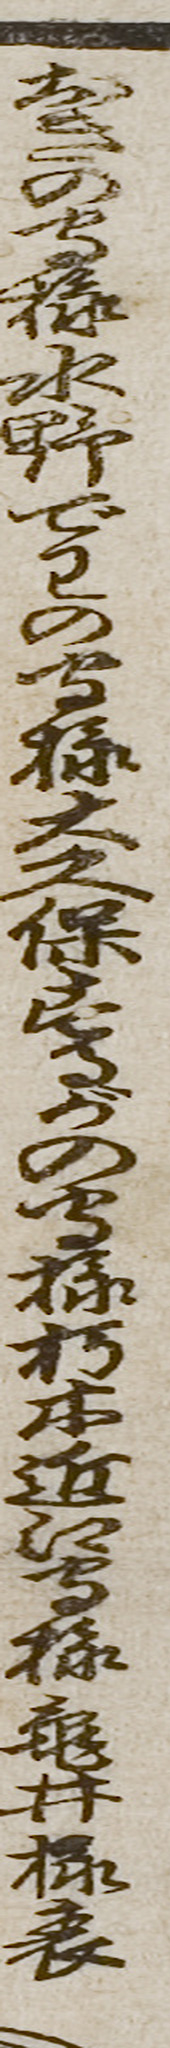おきの守様水野でわの守様大久保するがの守様朽木近江守様亀井様表
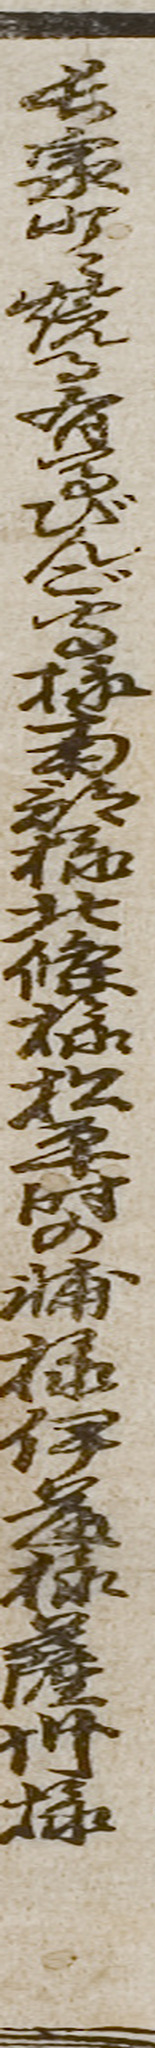長家少々焼る有馬びんご守様南部様北條様松平時の輔様伊藤様薩州様
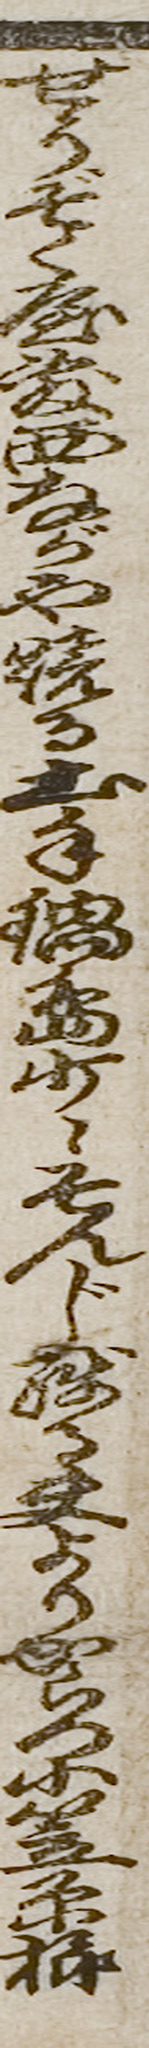せうぞく屋敷西ながや焼る土手鍋島少々そんじ残る夫よりからつ小笠原様
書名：江戸大地震出火場所分
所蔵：東京大学総合図書館 General Library in the University of Tokyo, JAPAN
